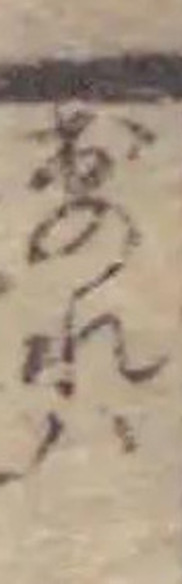おのれは
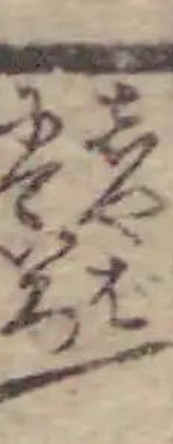しやば
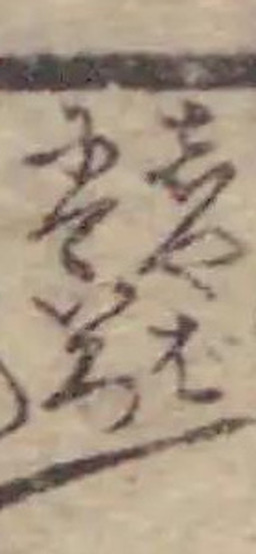にていろ
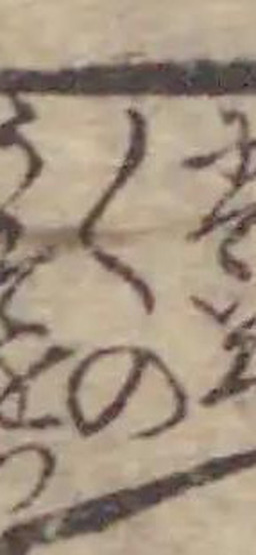うそをつ
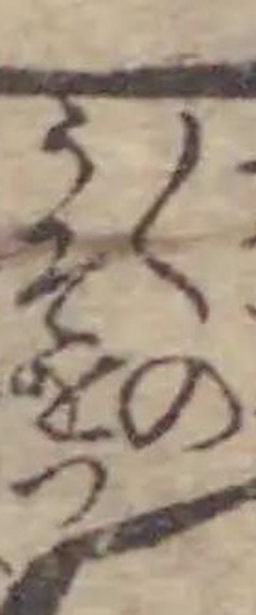うそをつ
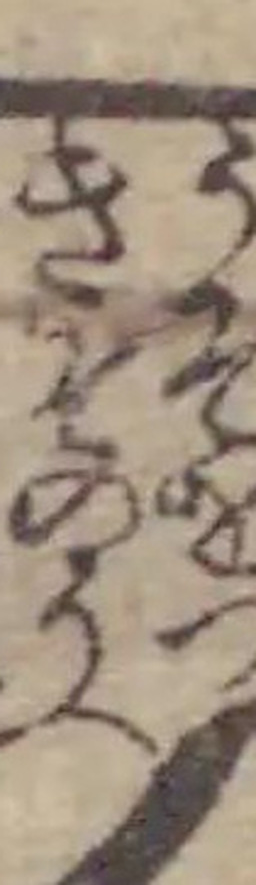きそのうへ
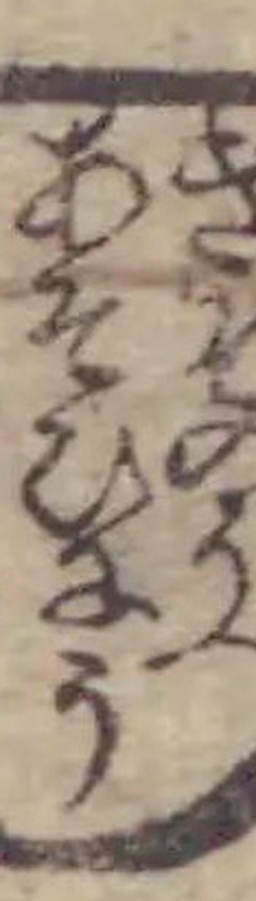あそひにう
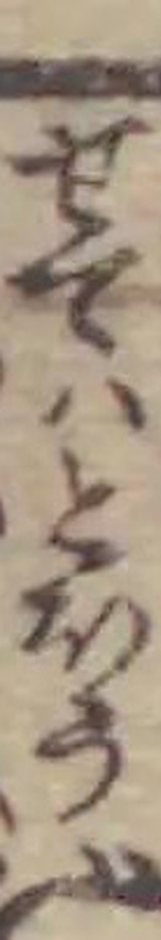せてはとほう
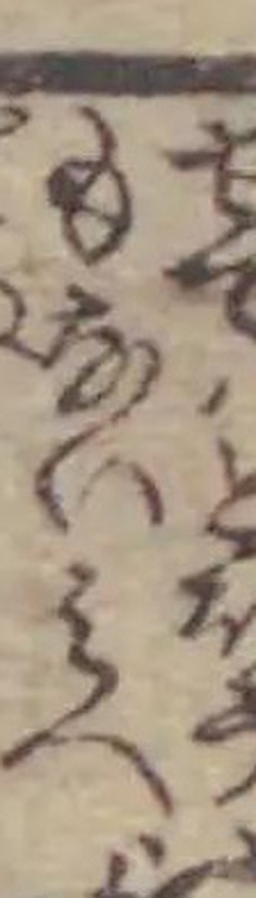もないみへ
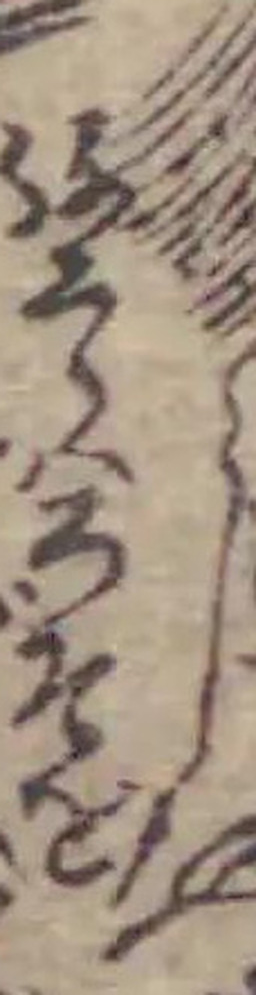弥二郎はうそを
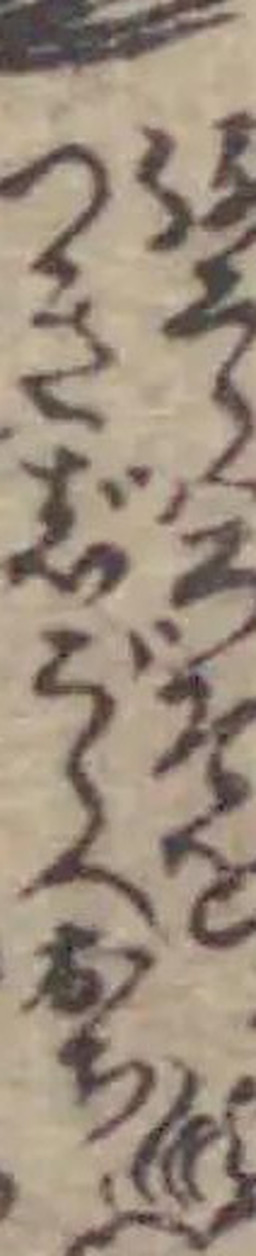つきじごくへおち
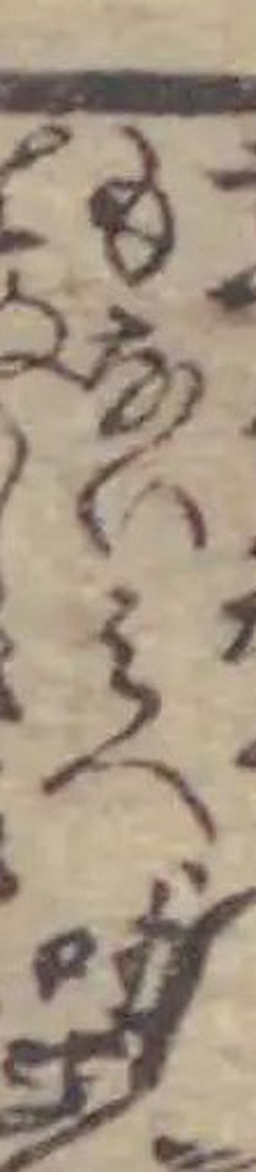もないみへ
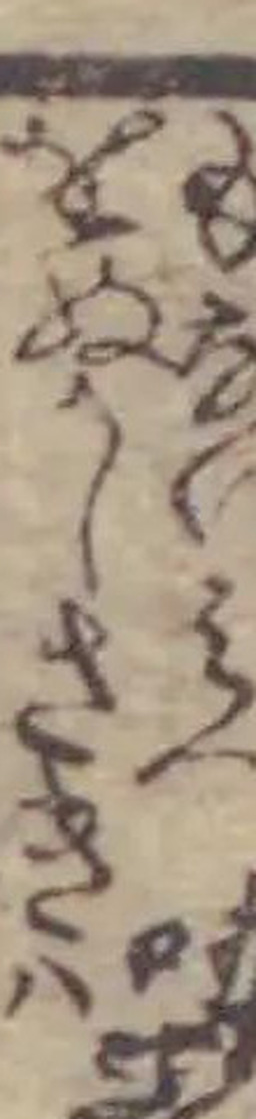をぬかしさきは
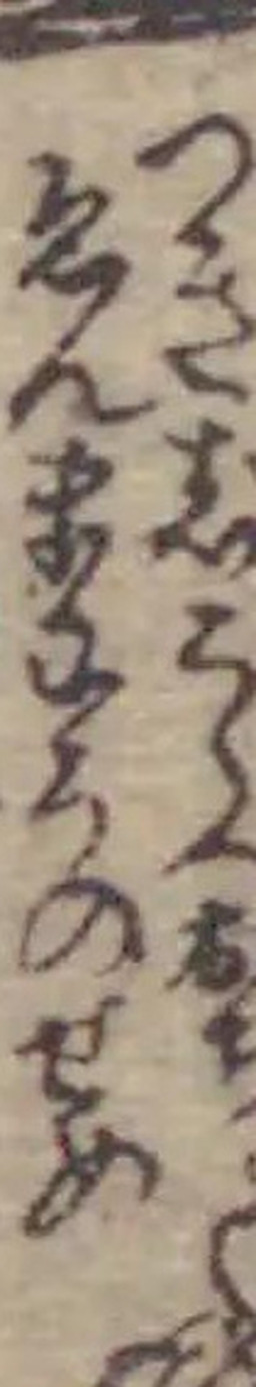ゑんまわうのせめ
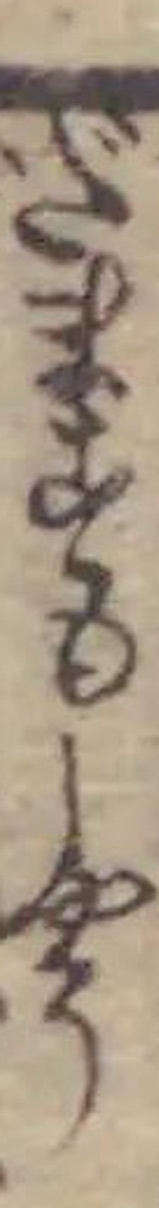だますもしやう
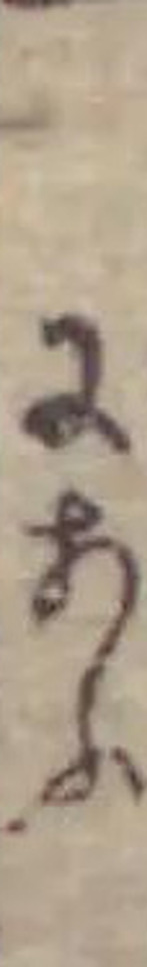にあふ
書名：虚言弥二郎傾城誠 3巻
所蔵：国立国会図書館 National Diet Library, JAPAN
